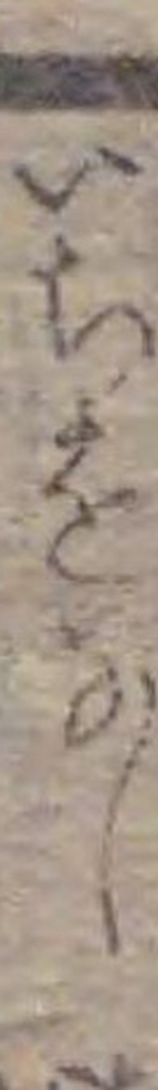いちをなし
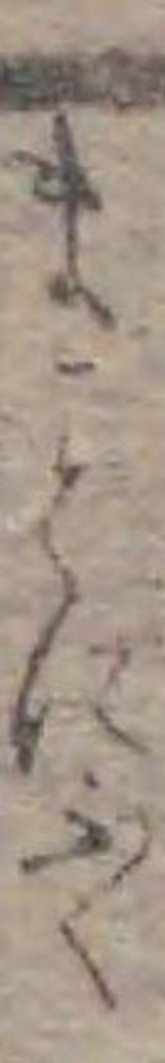まことにふく
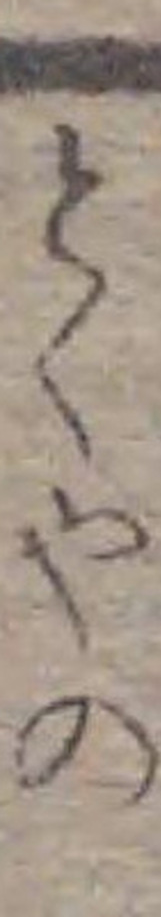とくやの
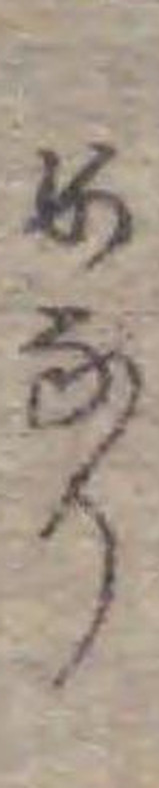めなり
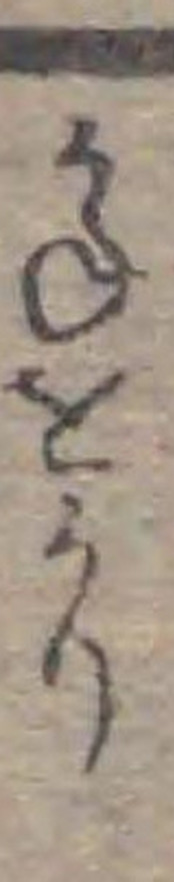かねをかり
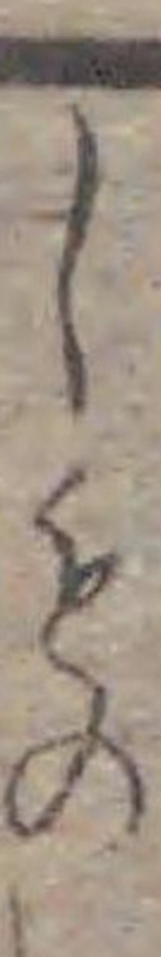しもの
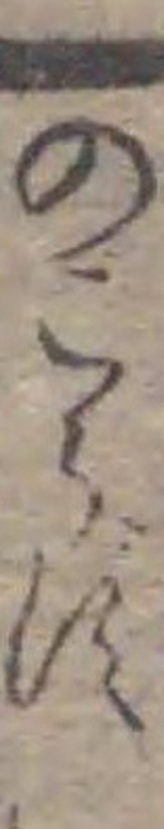のこらず
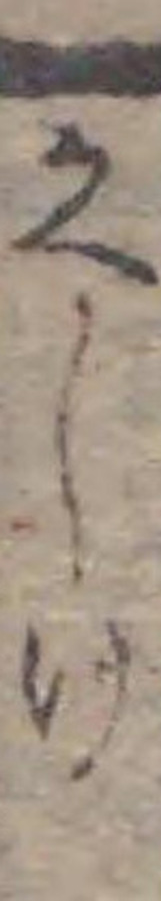かへしけ
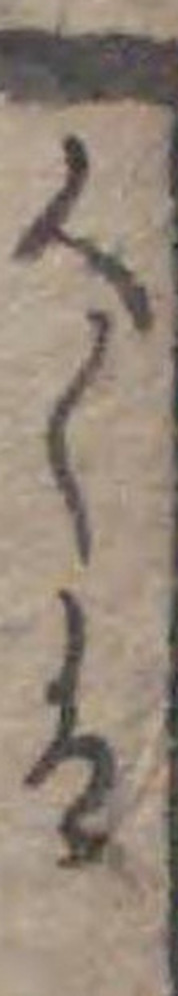人〳〵は
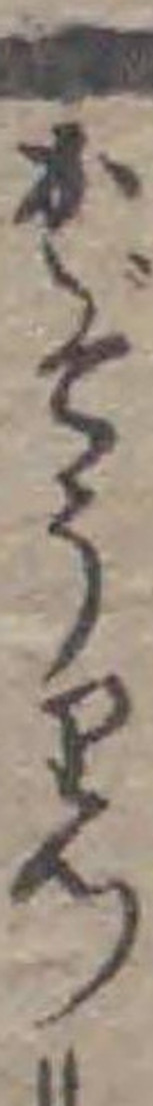かぞうりつ
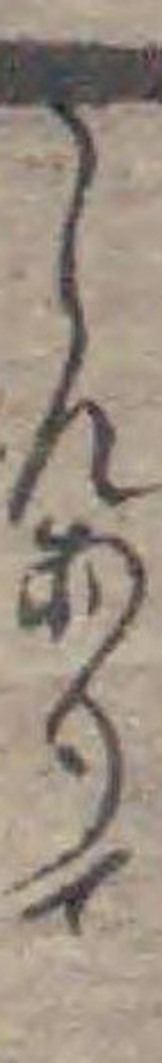しんありて
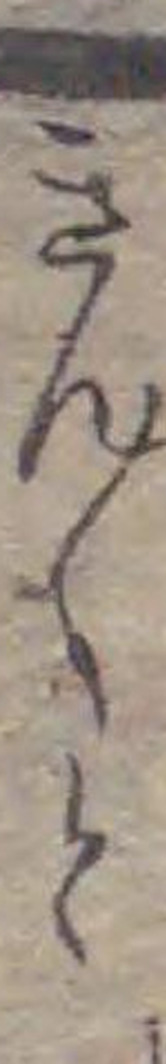きん〳〵と
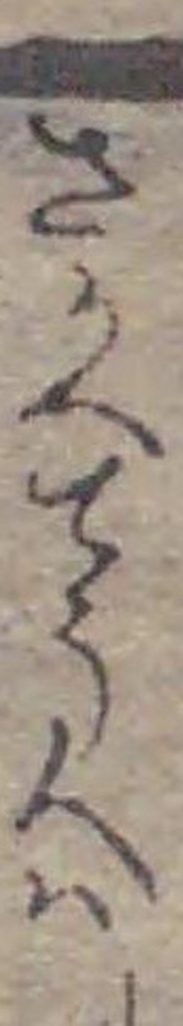さかへてう人は
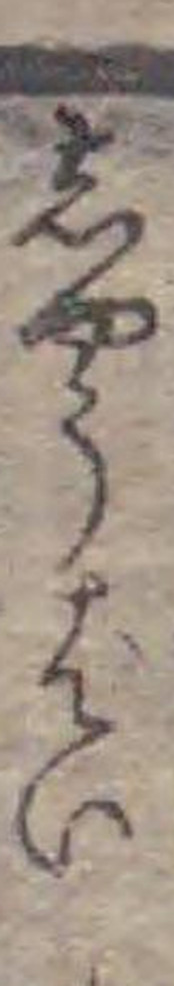しやうはい
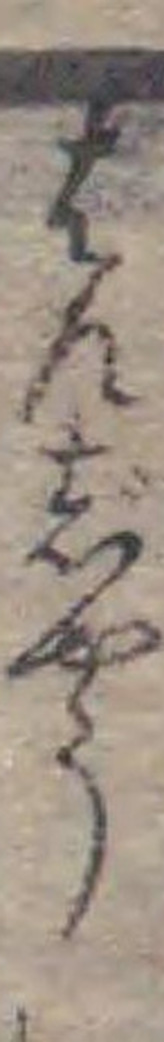はんじやう
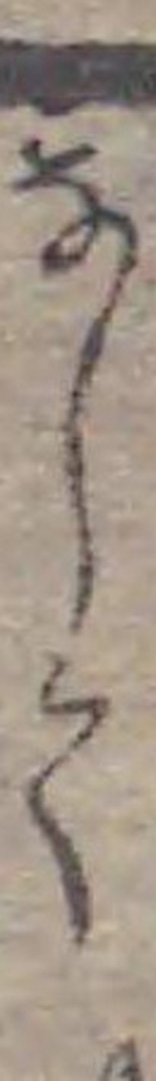なして
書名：紺屋百物語 : 3巻
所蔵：国立国会図書館 National Diet Library, JAPAN
